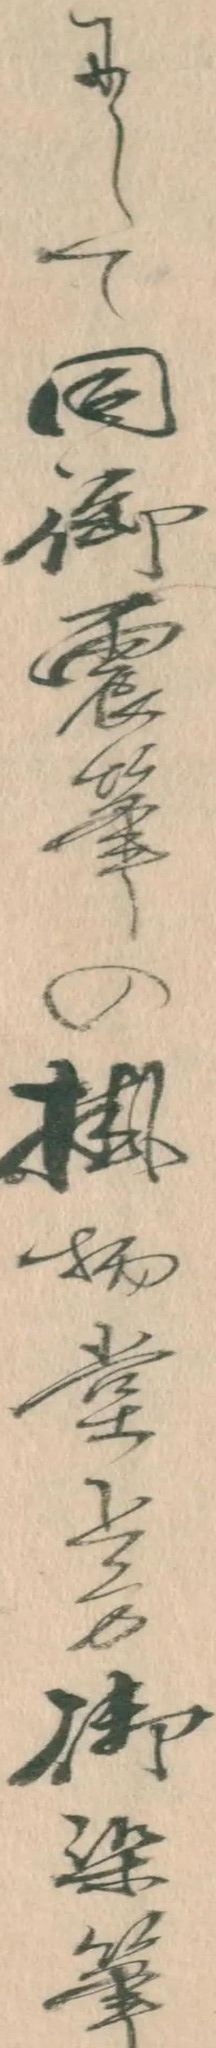にして同御震筆の掛物堂上方御染筆
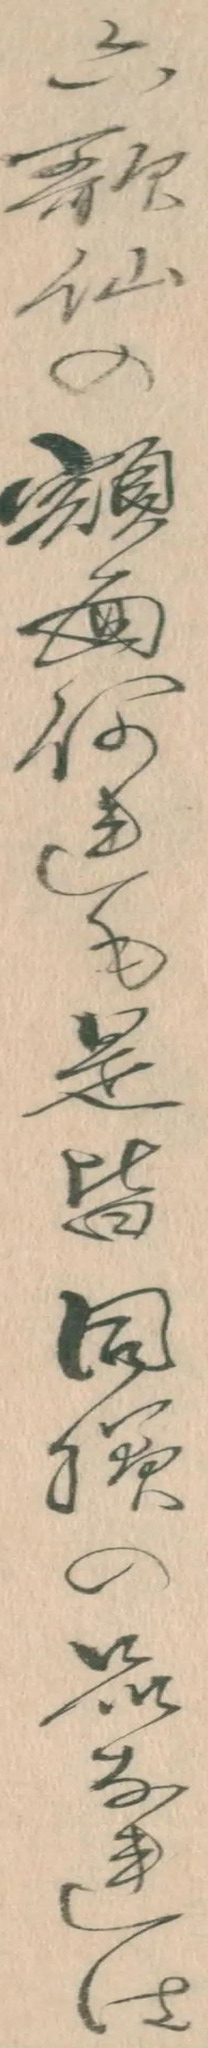六歌仙の額面何れも是皆同様の品なれは
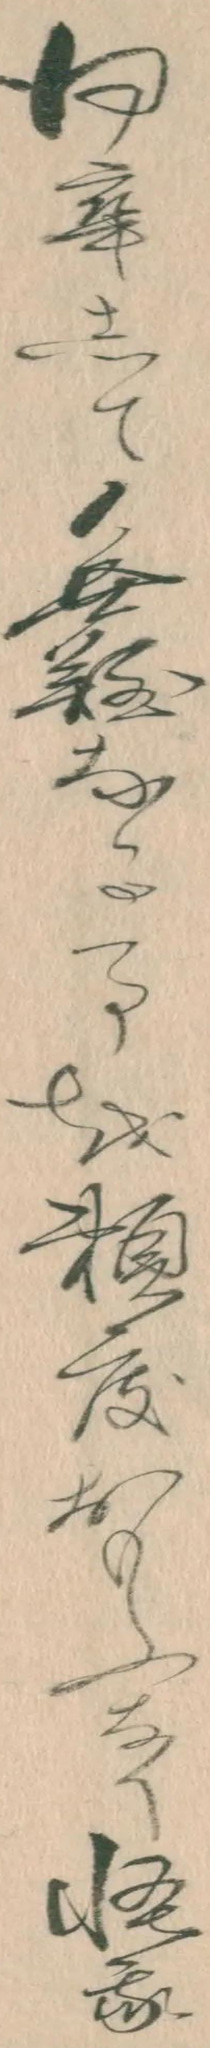何卒して無難なる事を頼度おもふなり怪我
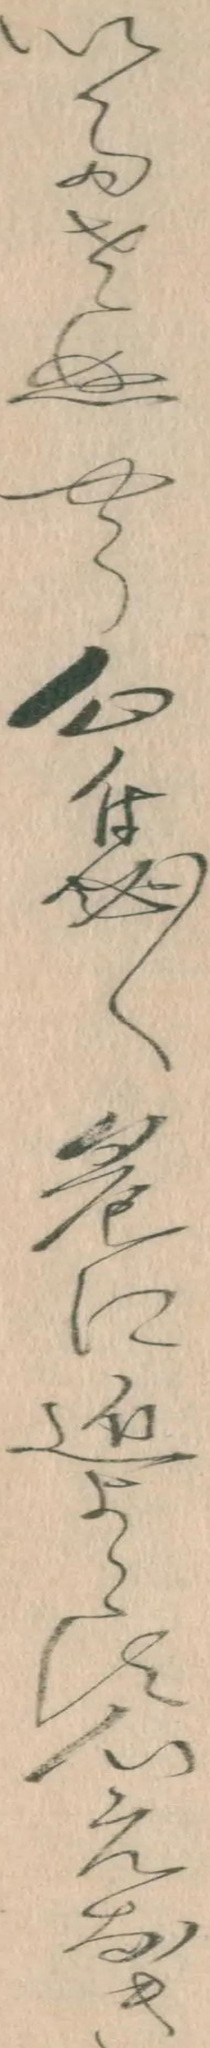いたさぬよう心付必〳〵危に近よらす心えなき
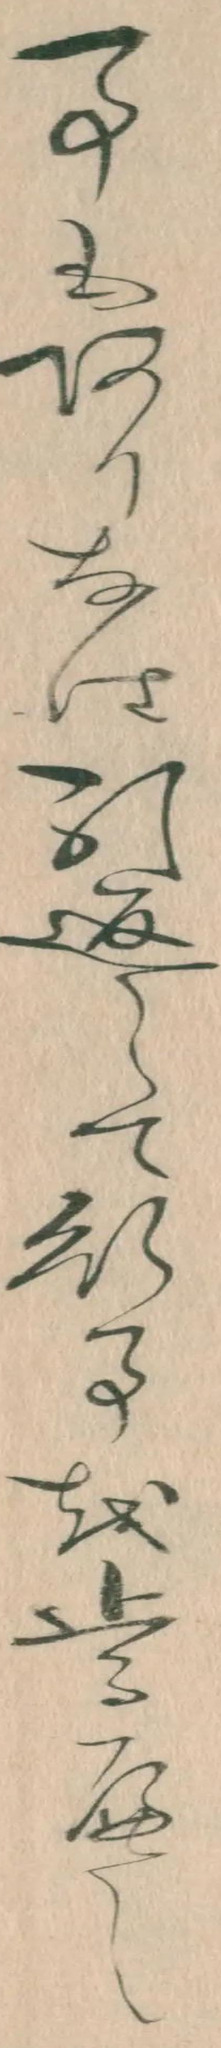事もありなは引返して行事を止るへし
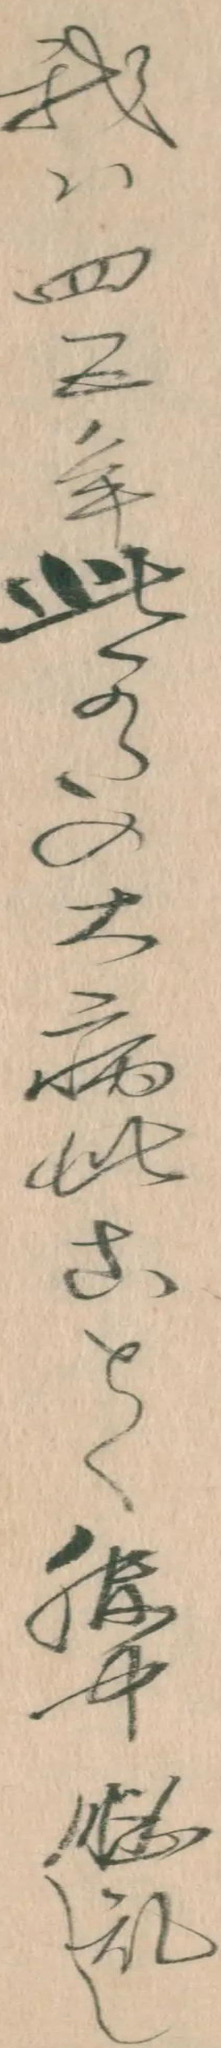我は四五年此かたの大病此ことく腹中悩乱し
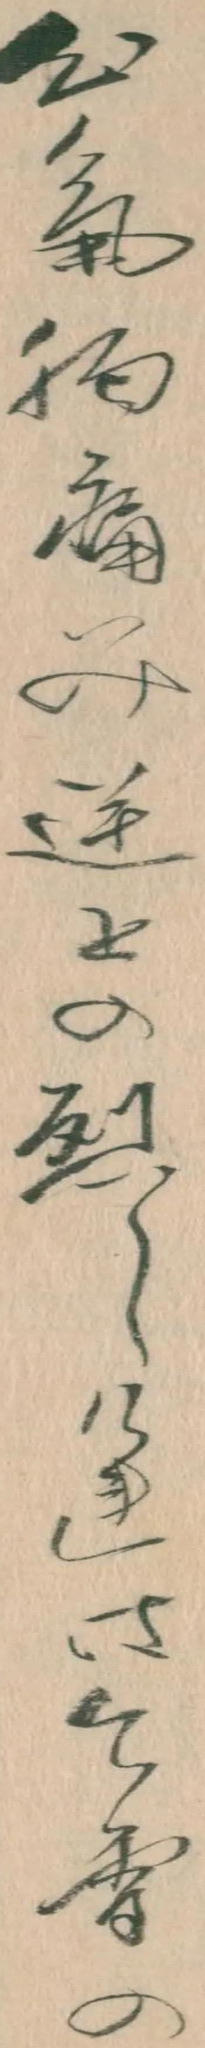心気胸痛み逆上の烈しけれは今宵の
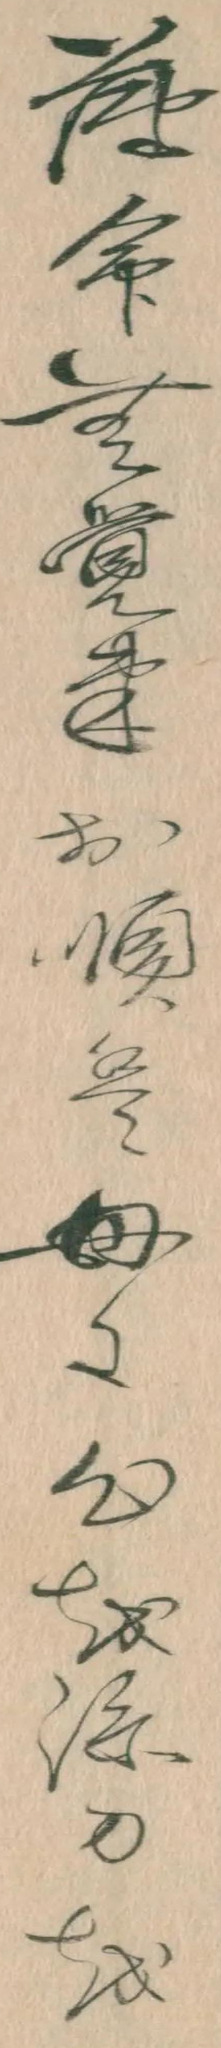薄命無覚束お順は母に心を添力を
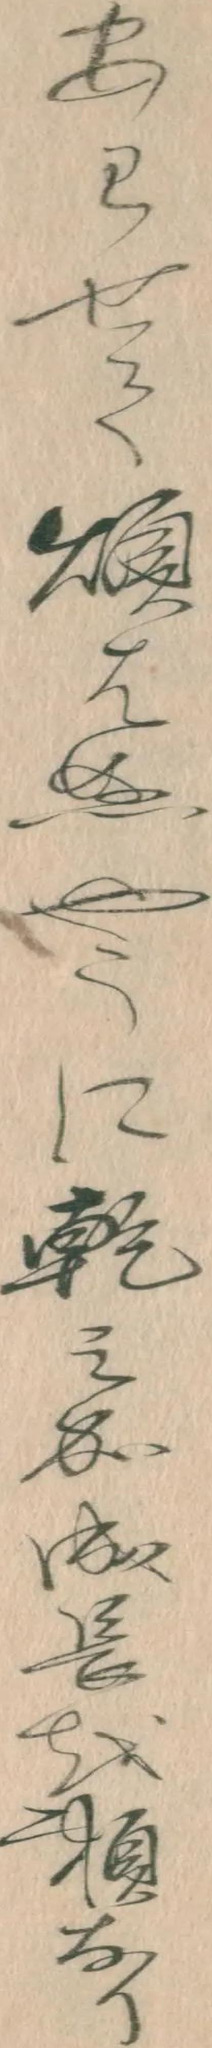あわせて煩はぬやうに乾三か成長を頼なり
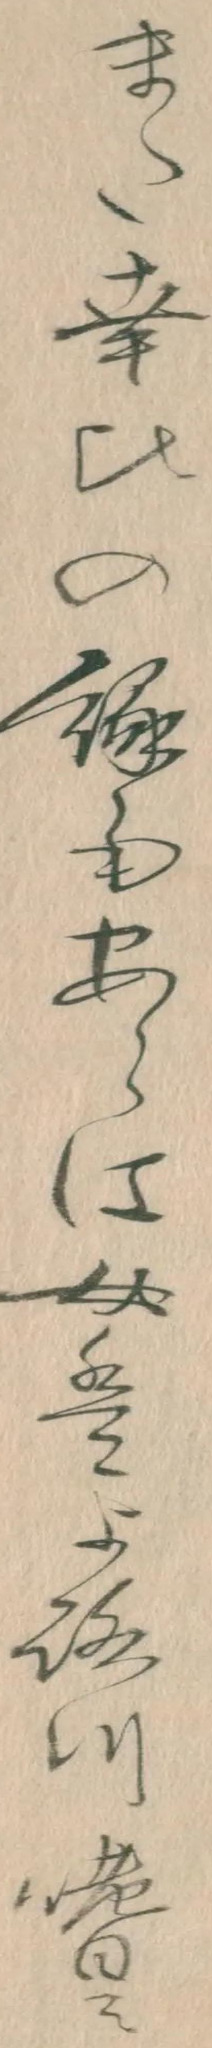また幸ひの縁もあらは女はよろつ嗜み
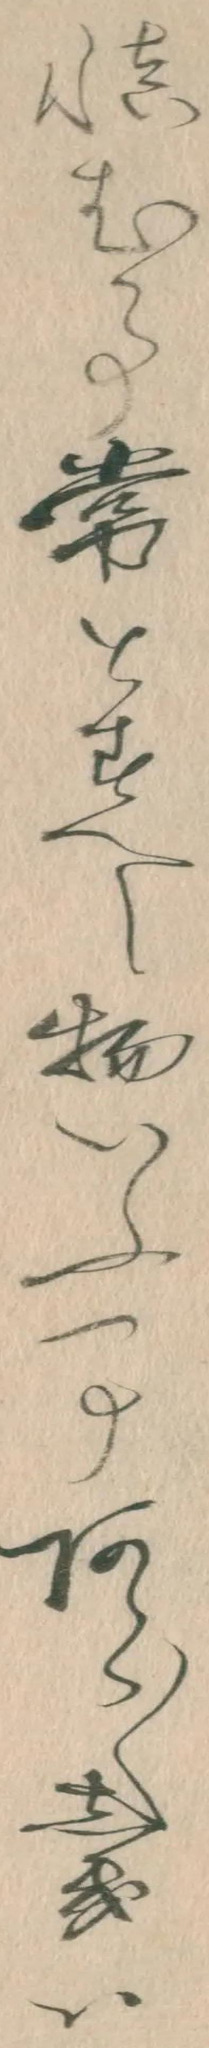慎む事常とすへし物いふ事あら〳〵しきは
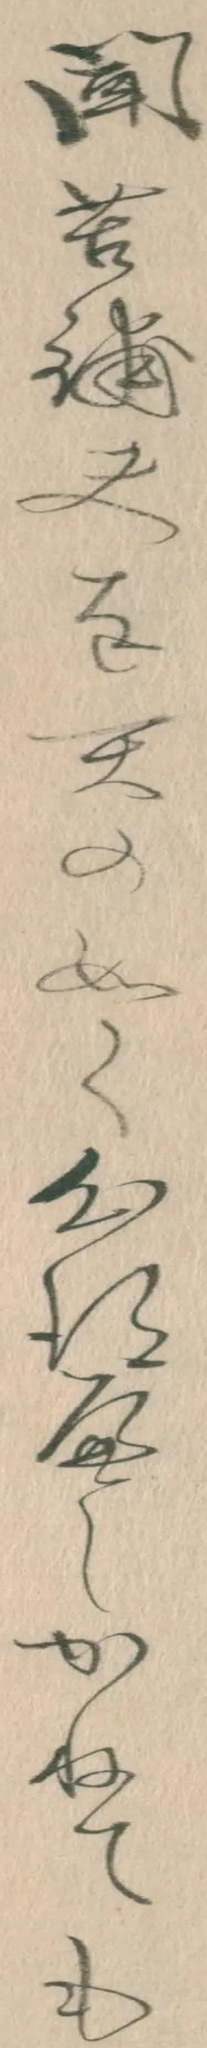聞苦鋪夫を天の如く心得へしかねても
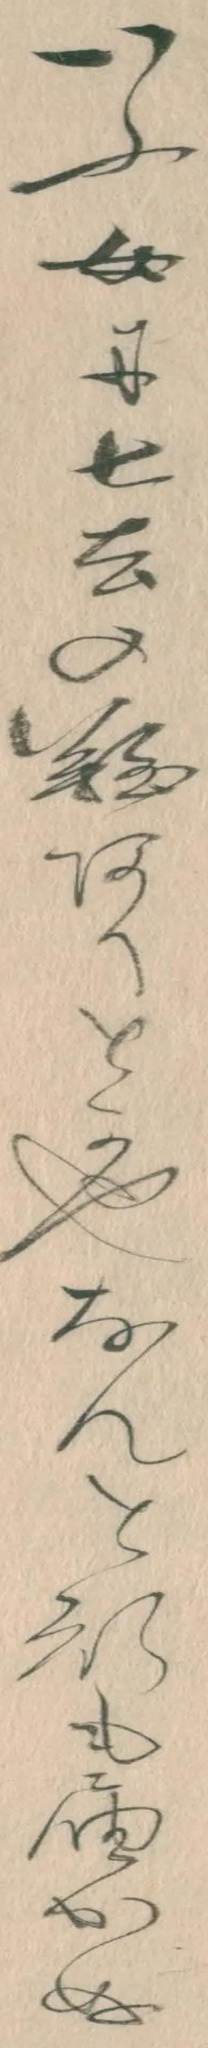いふ女に七去の難ありとか也なんと行も届かぬ
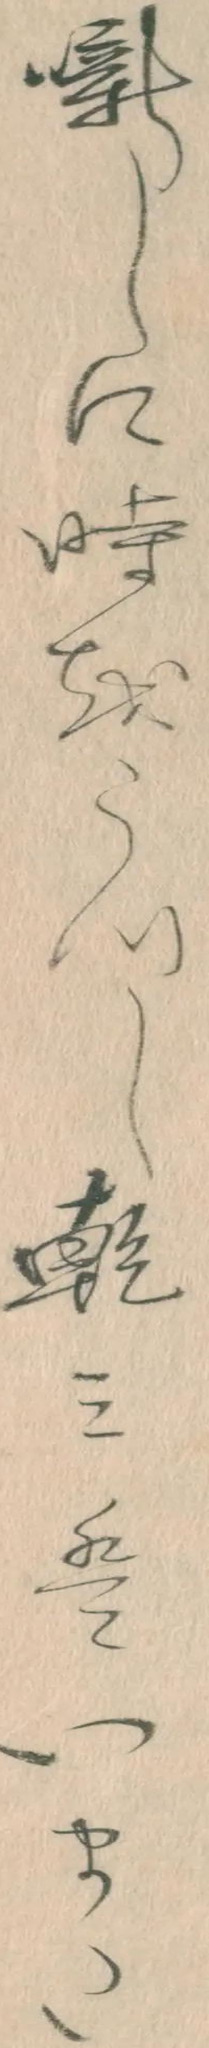噺しに時をうつし乾三はいまた
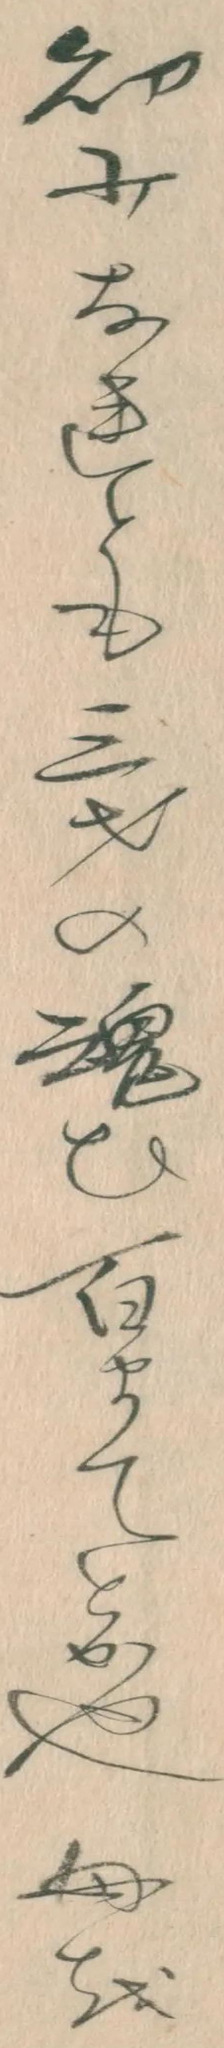幼少なれとも三才の魂ひ百まてとか也母を
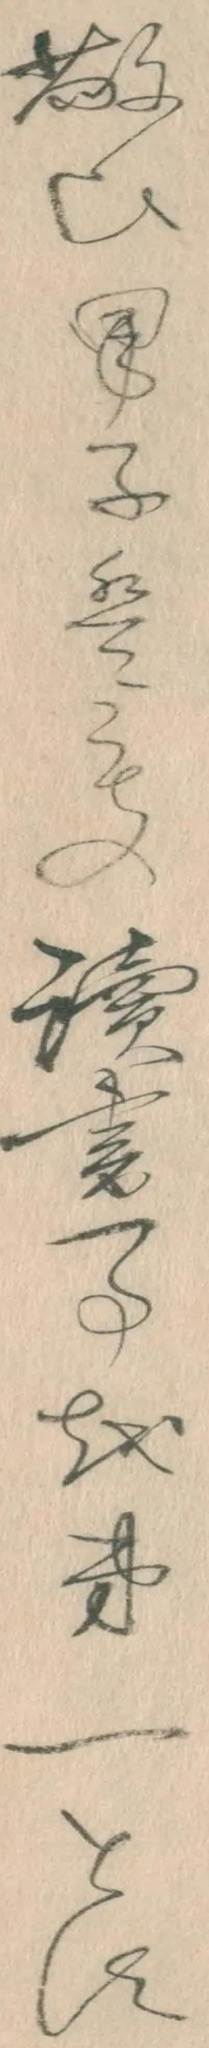敬ひ男子はもの読書事を第一とす
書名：俗語之種. [3]
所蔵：国立国会図書館 National Diet Library, JAPAN
